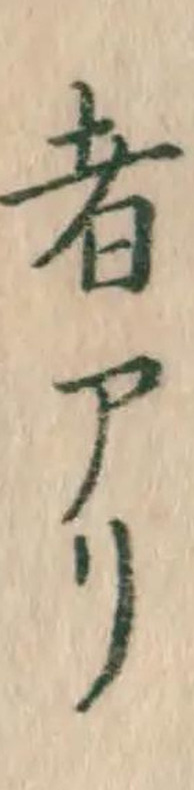者アリ
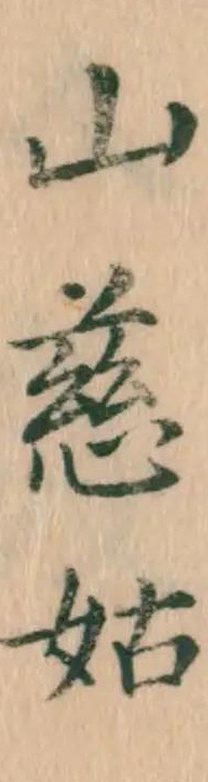山慈姑

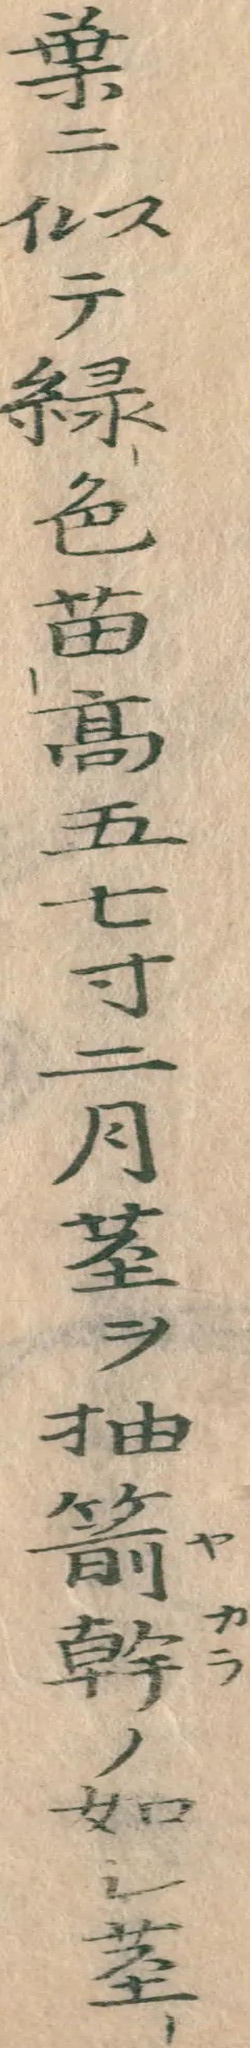葉ニ似テ緑-色苗-高五七寸二月茎ヲ抽箭幹ノ如シ茎-

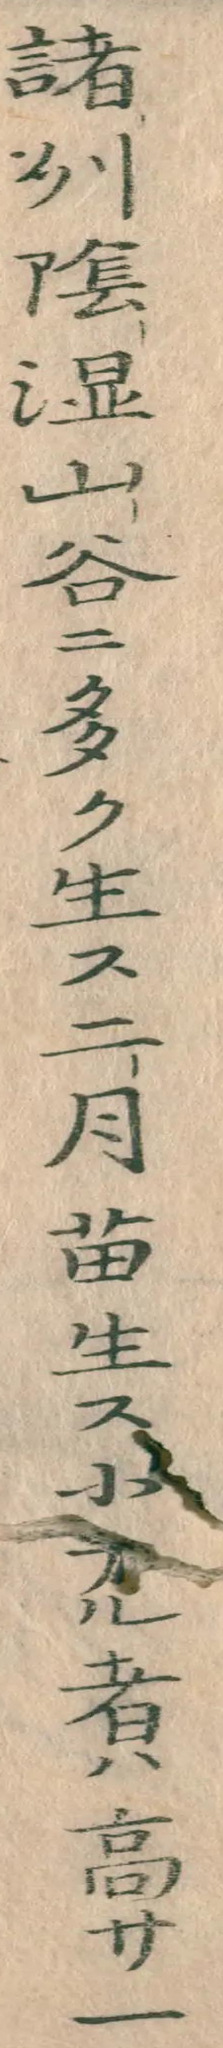諸-州陰-湿山-谷ニ多ク生ス二-月苗生ス小ナル者ハ高サ一
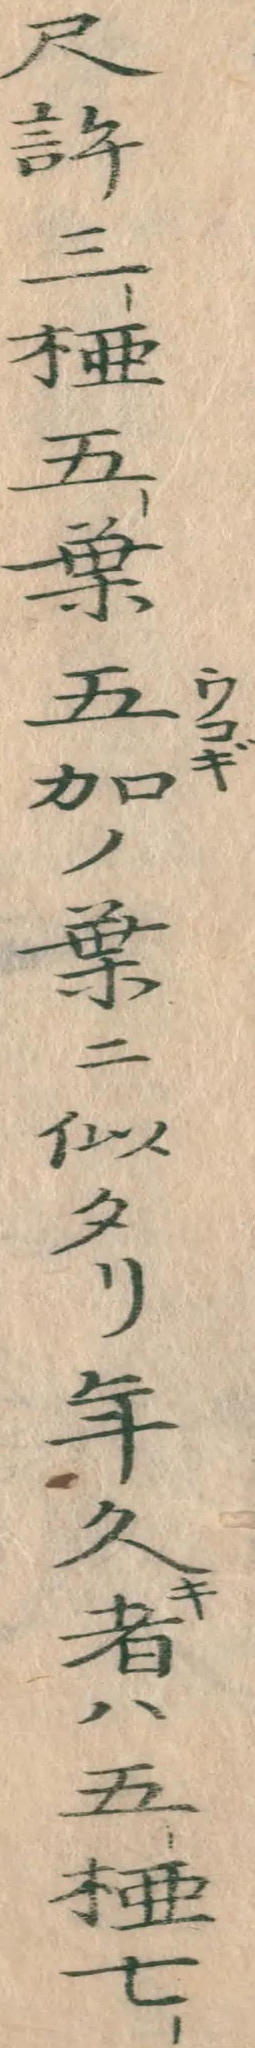尺許三-椏五-葉五加ノ葉ニ似タリ年久者ハ五-椏七-
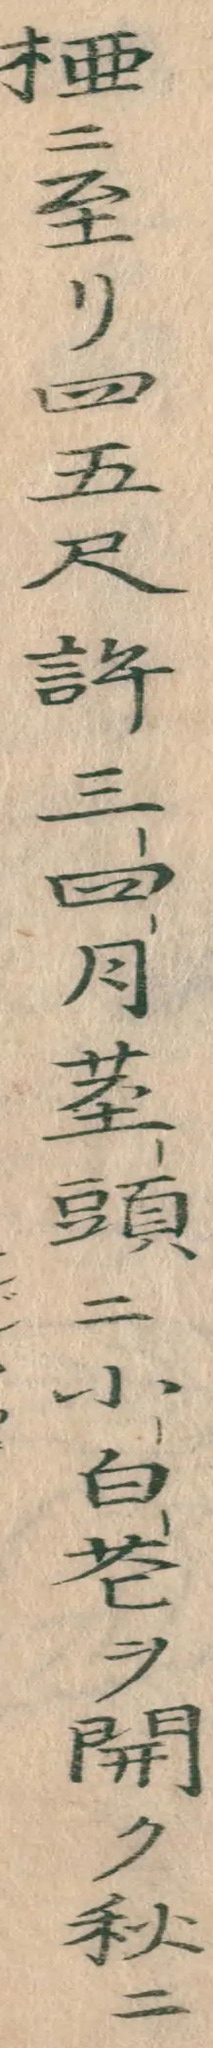椏二至リ四五尺許三-四-月茎-頭ニ小-白-花ヲ開ク秋ニ
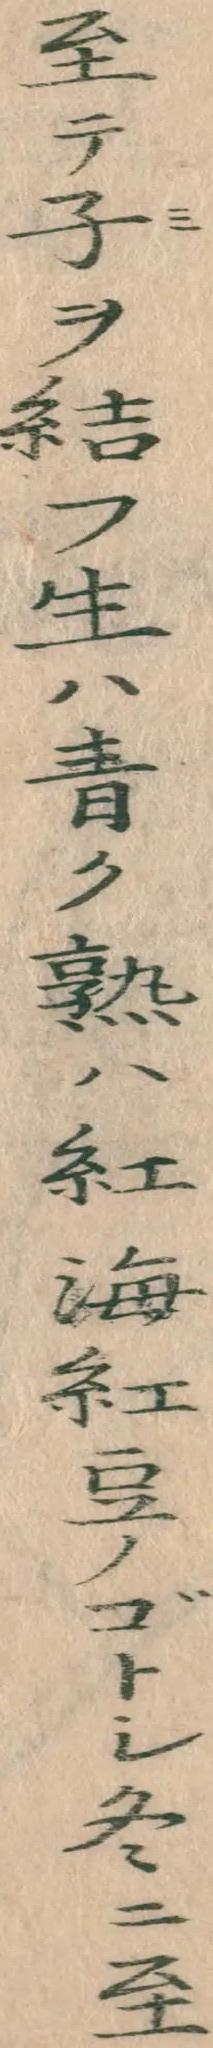至テ子ヲ結フ生ハ青ク熟ハ紅海紅豆ノゴトシ冬ニ至
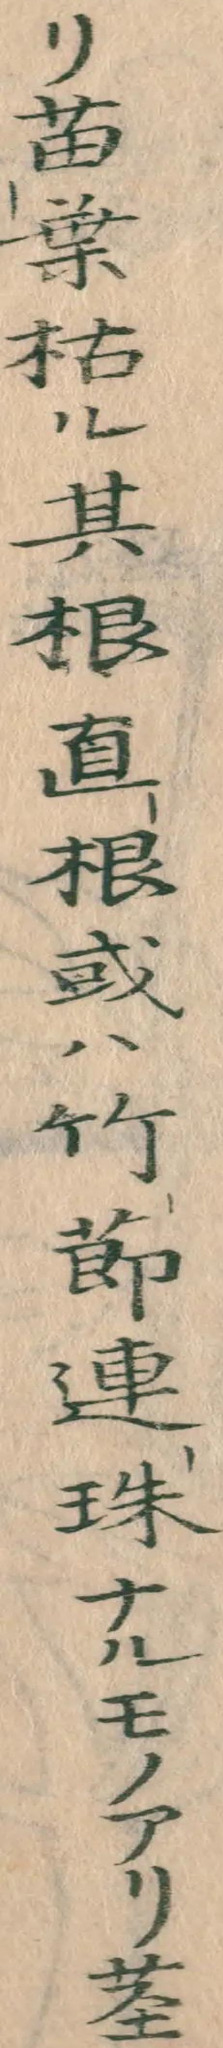リ苗-葉枯ル其根直-根或ハ竹-節連-珠ナルモノアリ茎
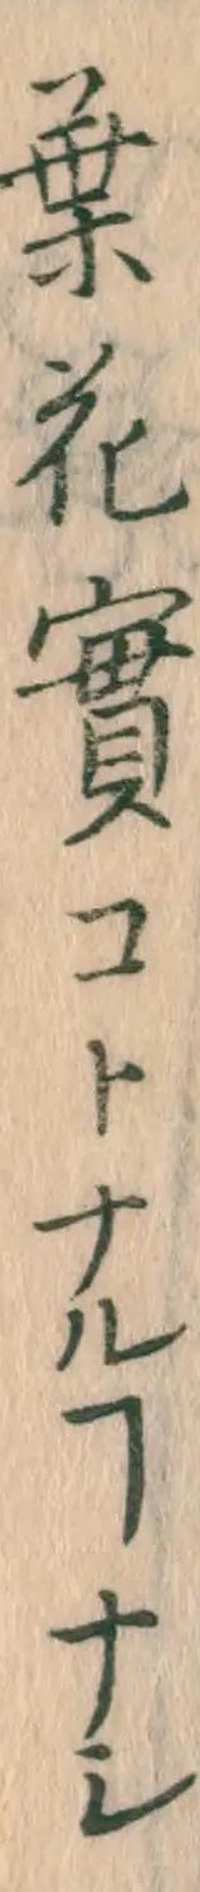葉花実コトナルコトナシ
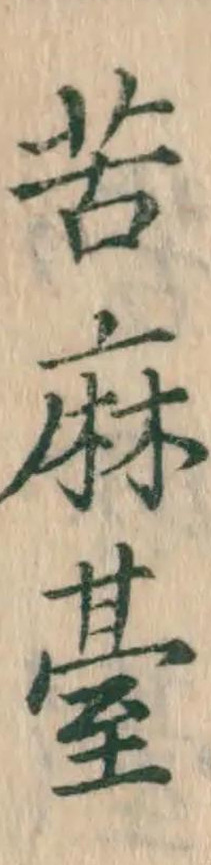苦麻台

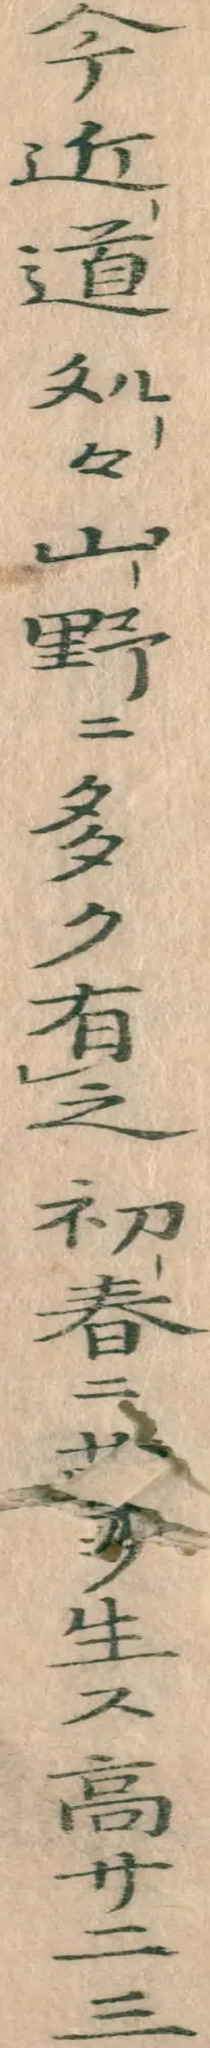今近-道処-々山-野ニ多ク有之初-春ニヲ生ス高サ二三
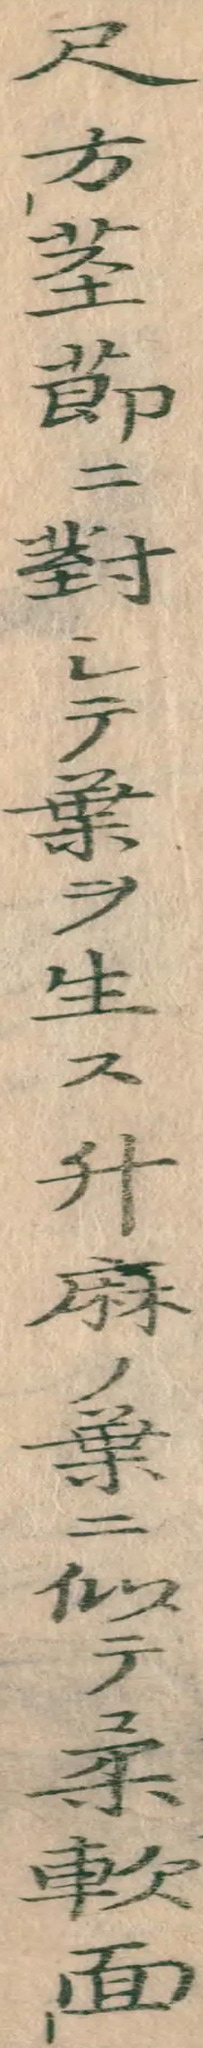尺方-茎節ニ対シテ葉ヲ生ス升麻ノ葉ニ似テ柔軟面-
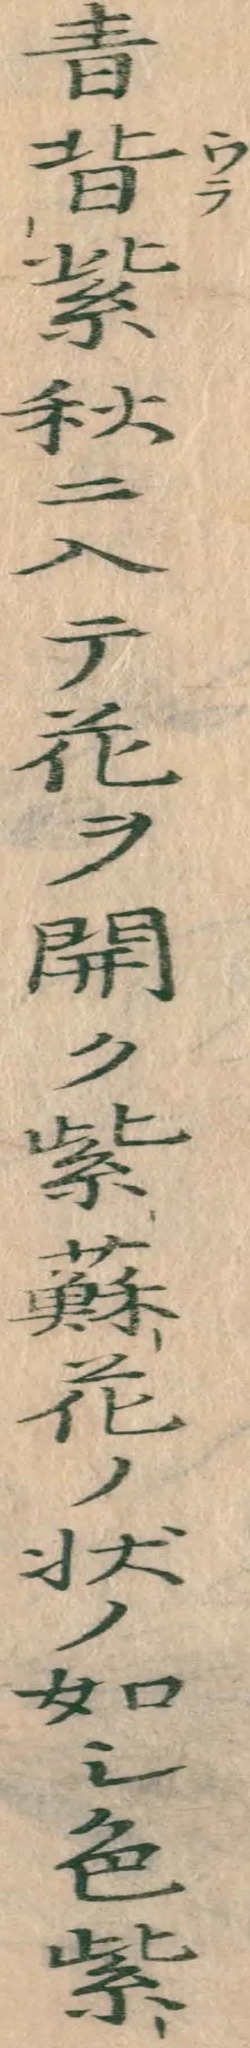青背-紫秋ニ入テ花ヲ開ク紫-蘇-花ノ状ノ如シ色紫-
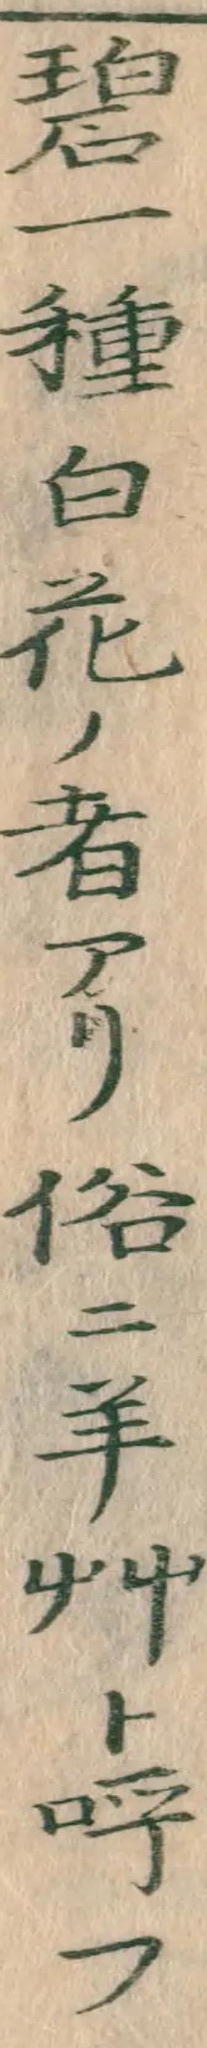碧一種白花ノ者アリ俗ニ羊艸ト呼フ

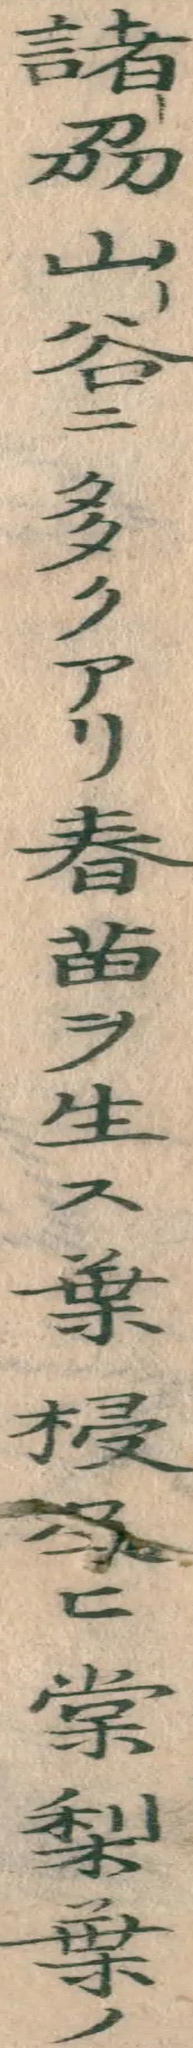諸-州山-谷ニ多クアリ春苗ヲ生ス葉梫ヒ棠梨葉ノ
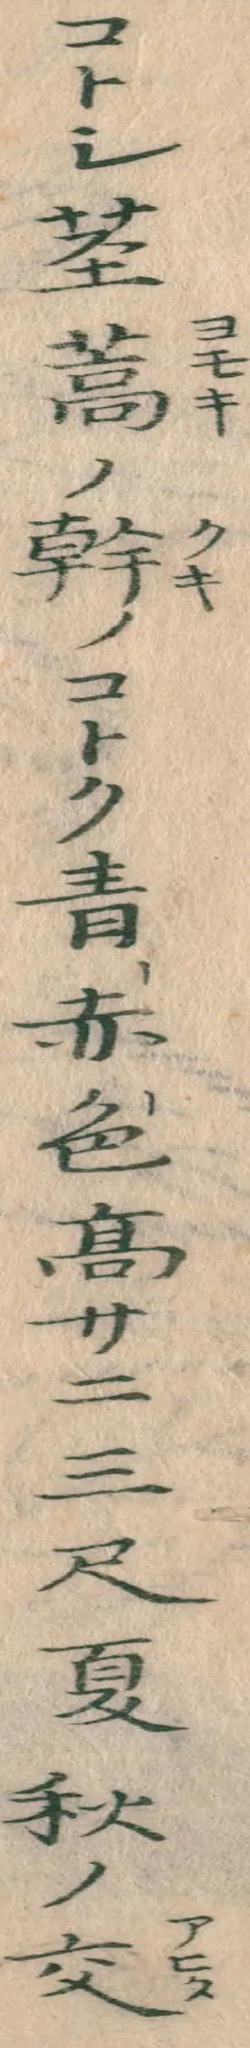コトシ茎蒿ノ幹ノコトク青-赤-色高サ二三尺夏秋ノ交
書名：花彙 草部4巻木部4巻. [1]
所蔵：国立国会図書館 National Diet Library, JAPAN
